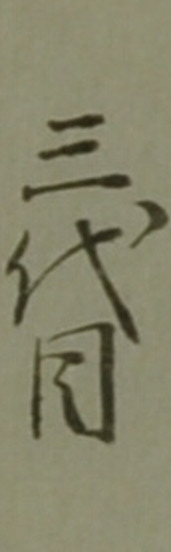三代目
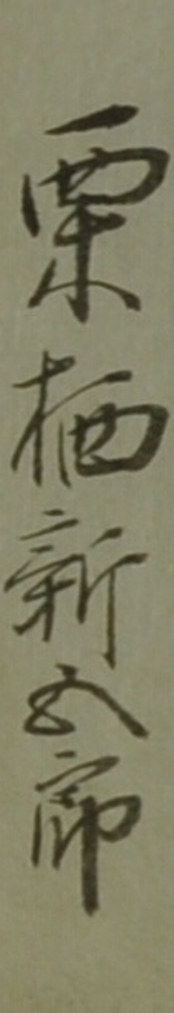栗栖新五郎
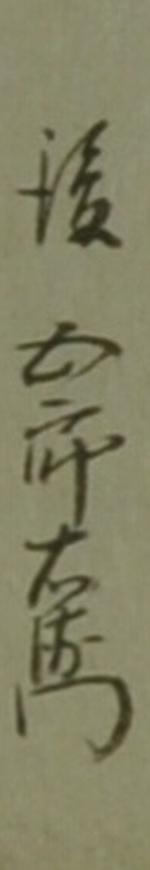後五郎右衛門
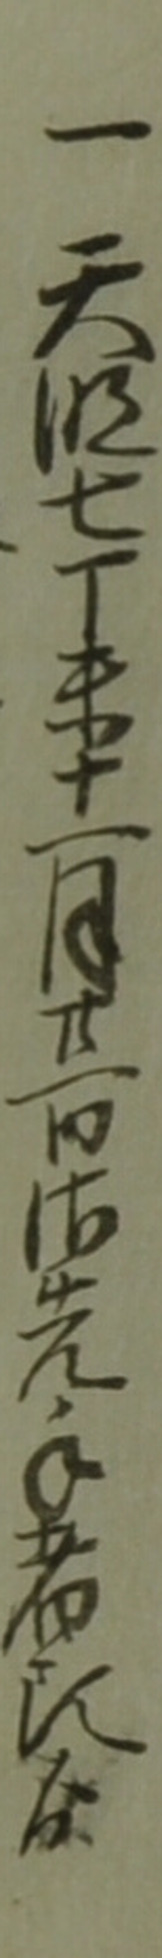一天明七丁未十一月廿一日御先手者頭ゟ
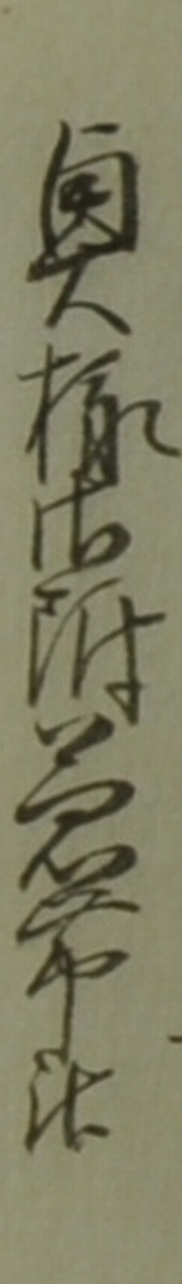奥様御附兼帯被
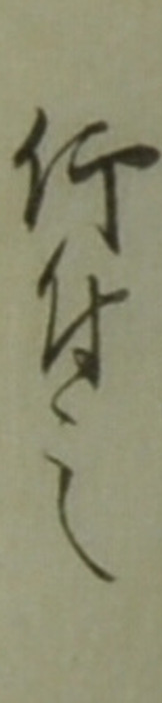仰付之

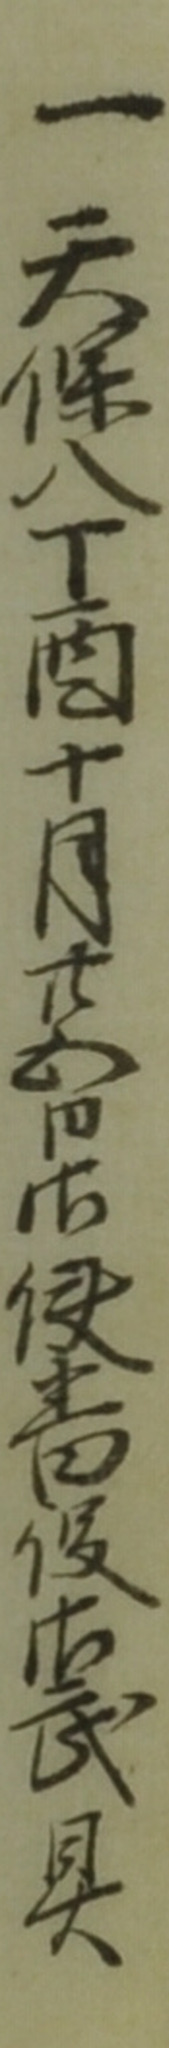一天保八丁酉十月廿五日御使番役御武具
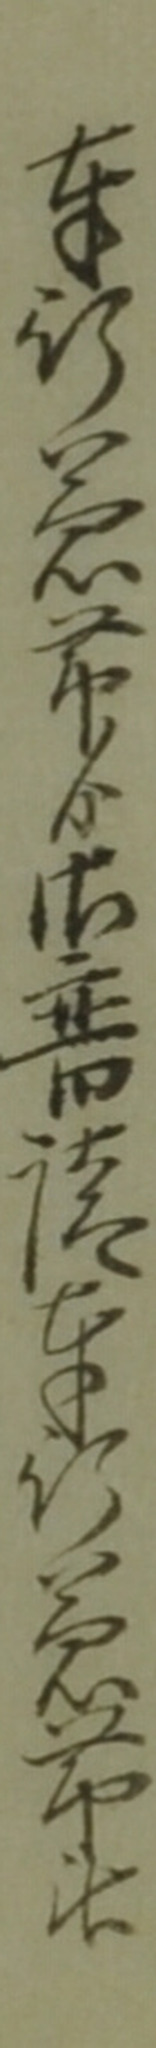奉行兼帯ゟ御普請奉行兼帯被
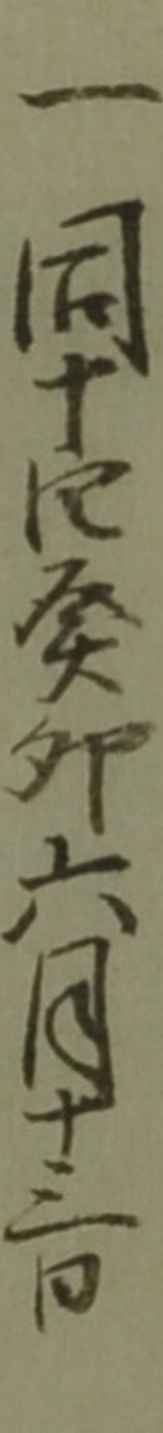一同十四癸卯六月十三日
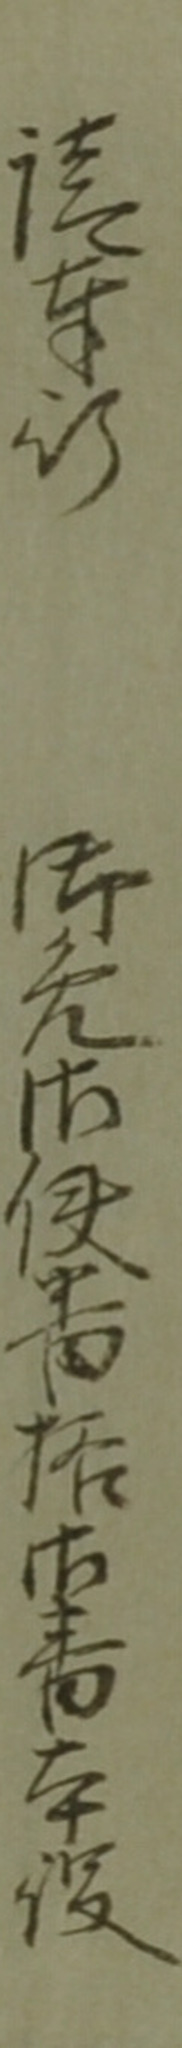請奉行御免御使番格御番本役
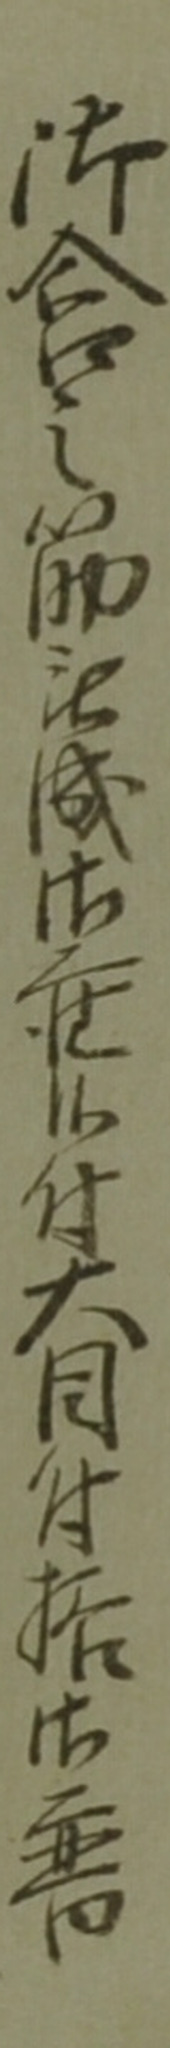御含之筋被成御座候付大目付格御普
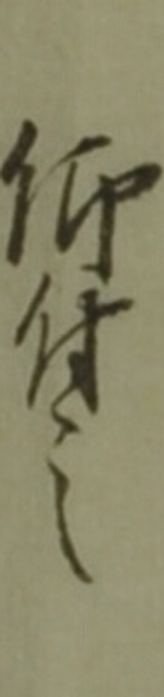仰付之
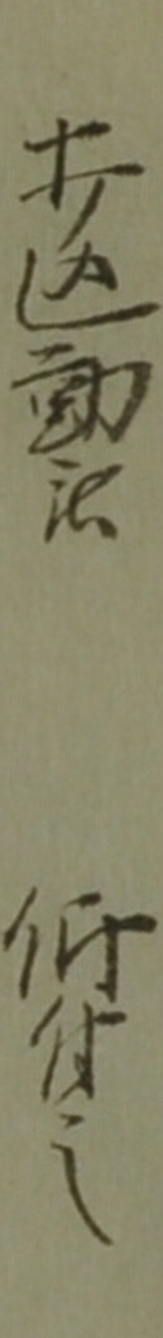打込勤被仰付之
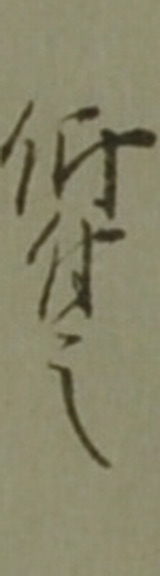仰付之
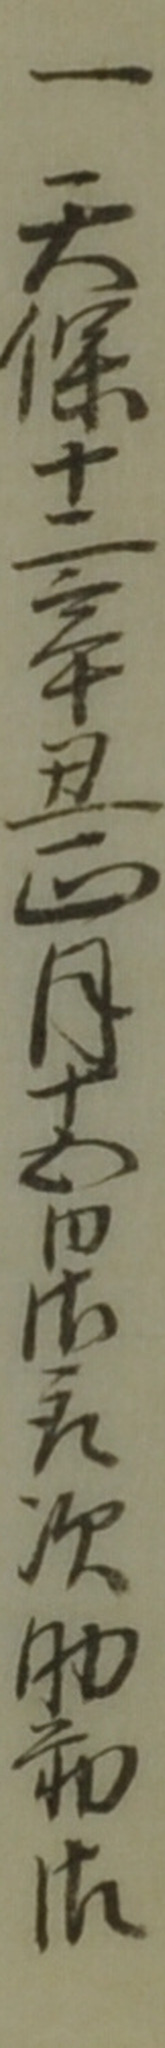一天保十二辛丑正月十五日御取次助勤御
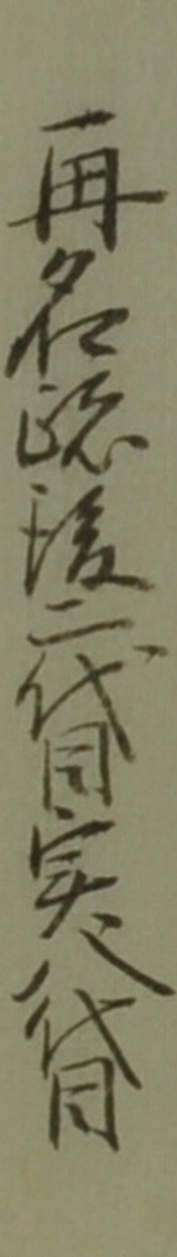再名跡後二代目実八代目
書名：諸御役代々録（六）
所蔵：伊那市立高遠町図書館・合同会社AMANE
